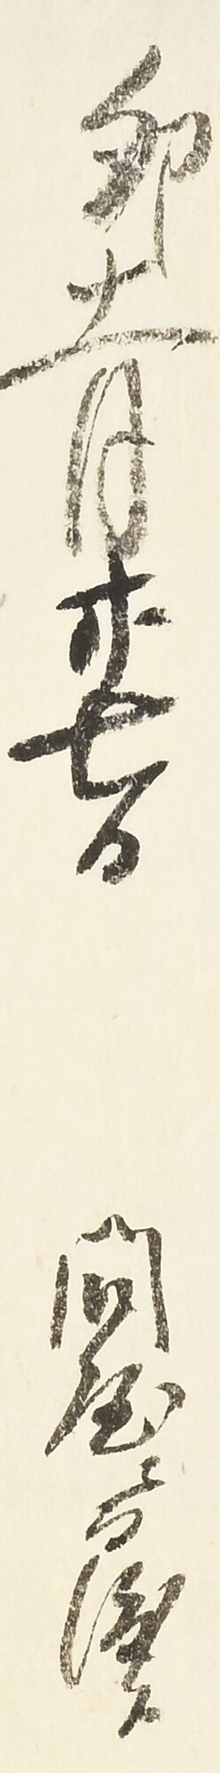卯十一月廿七日問屋ニ而渡ス
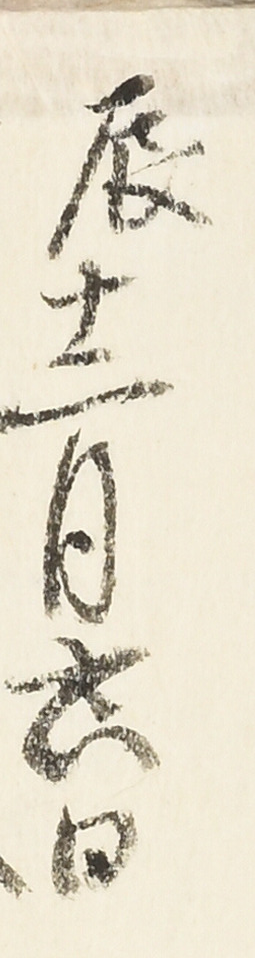辰十二月六日
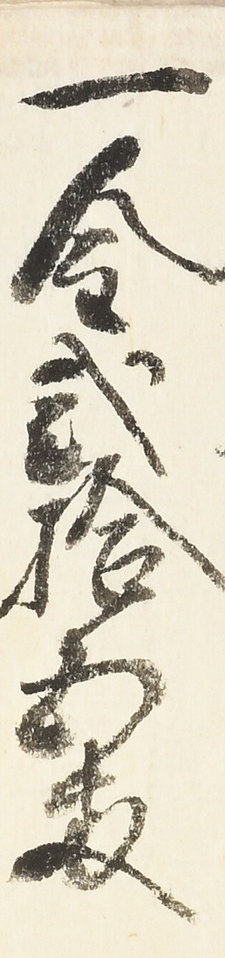一金弐拾五両
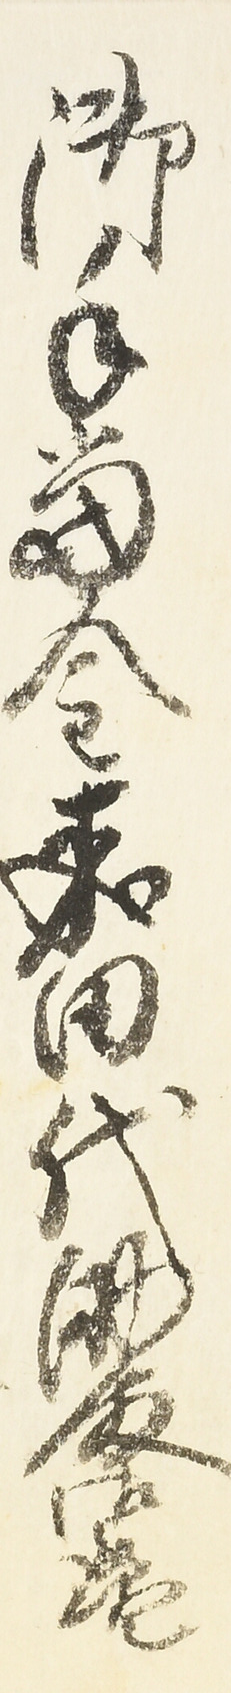御手当金森田大助殿御取次
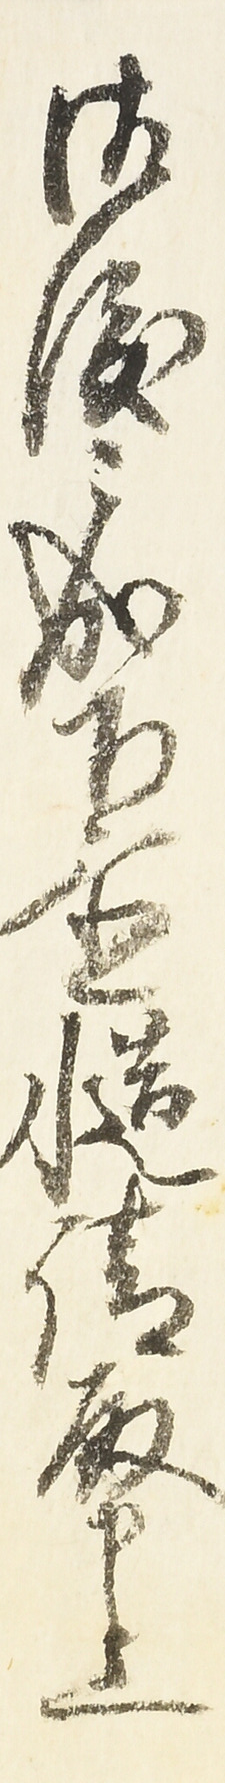御渡被成下置慥請取申上
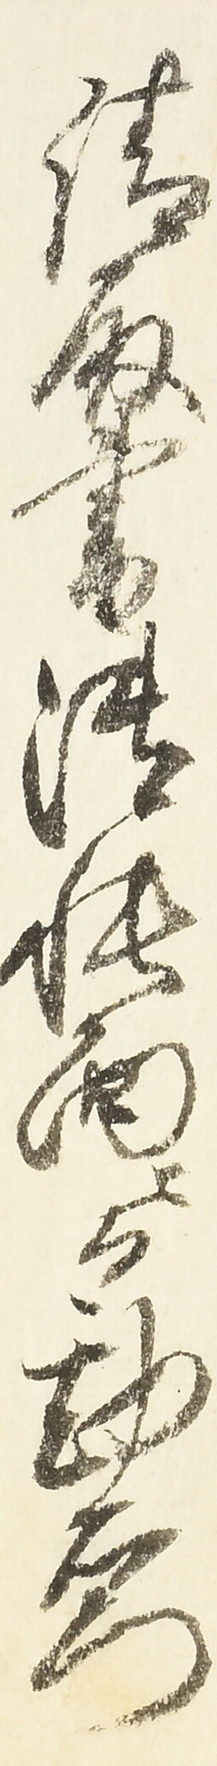請取書御帳面ニ而勘右衛門
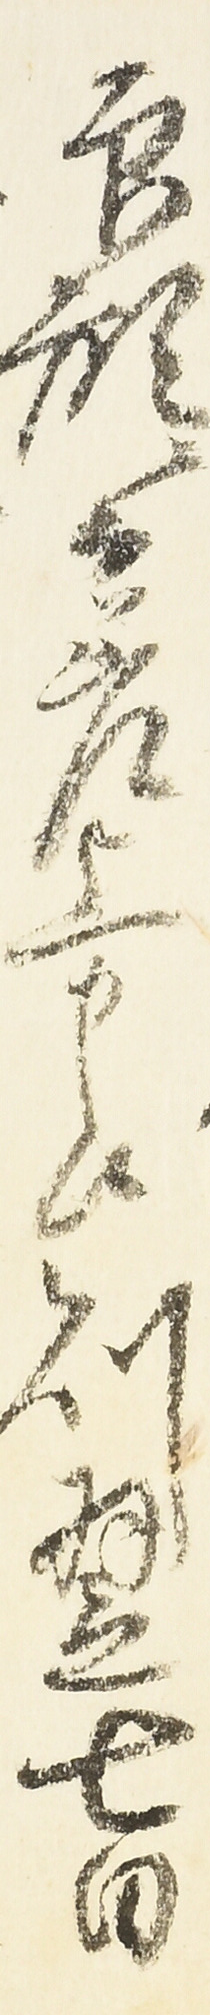印形ニ而差上申候則翌七日
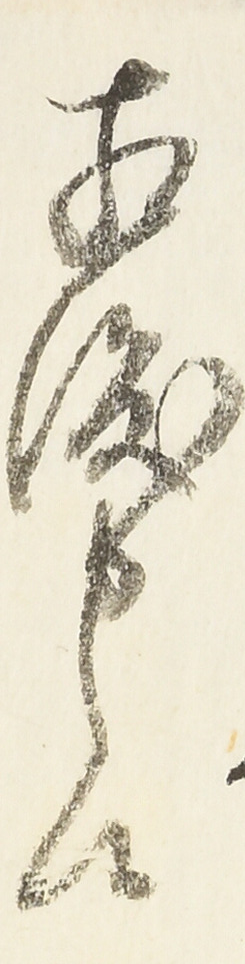相渡申候
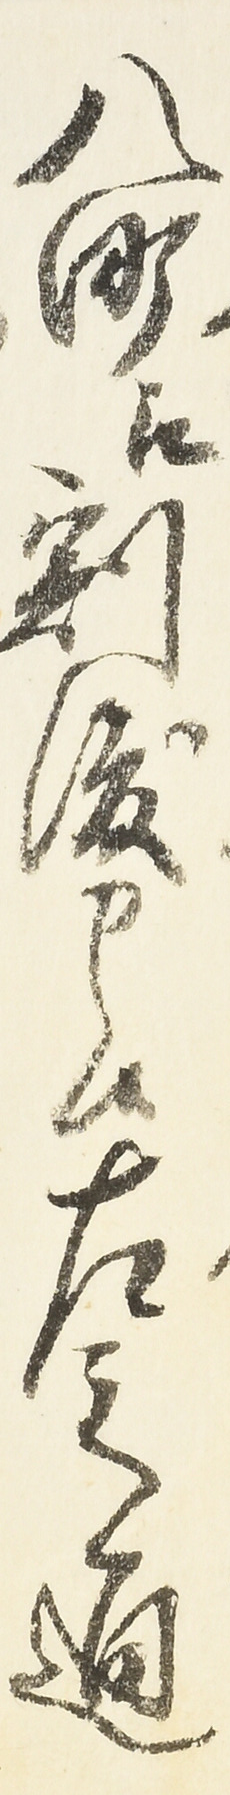八町江割渡申候左之通

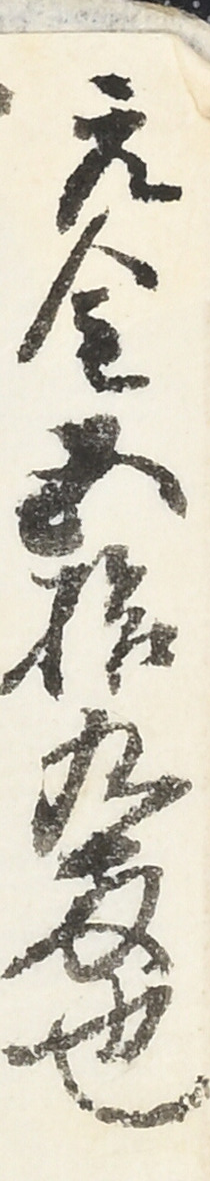元金五拾九両也
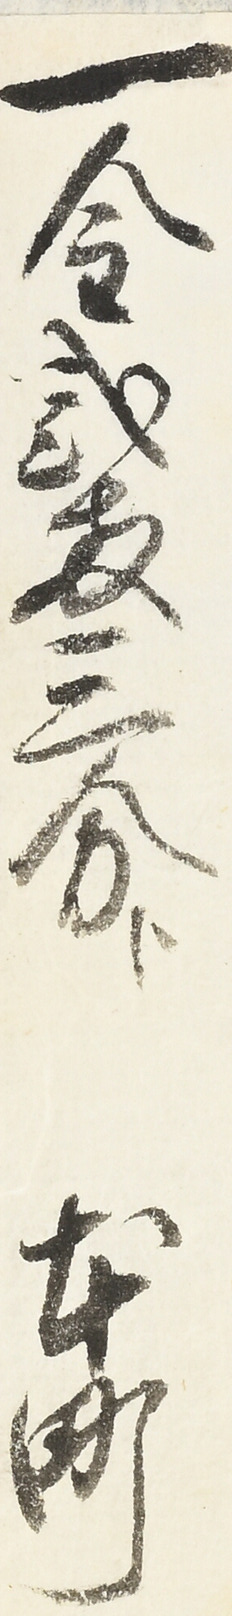一金弐両三分ト本町
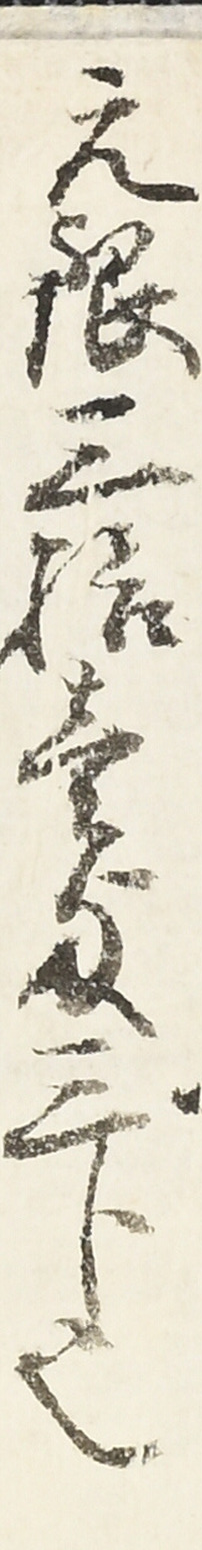元銀三拾壱匁三分也
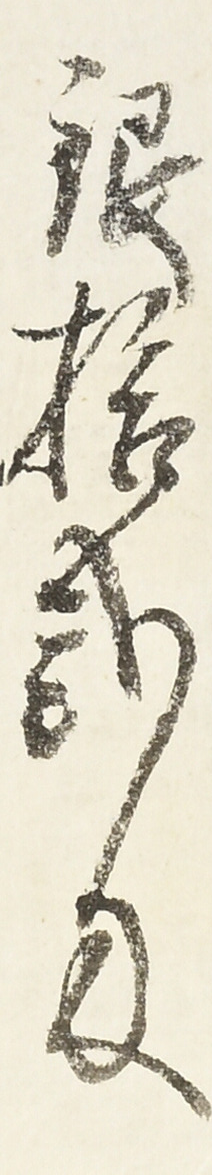銀拾弐匁
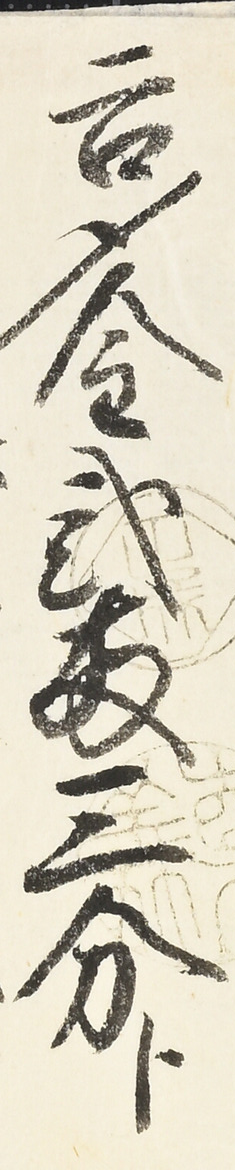二口〆金弐両三分ト
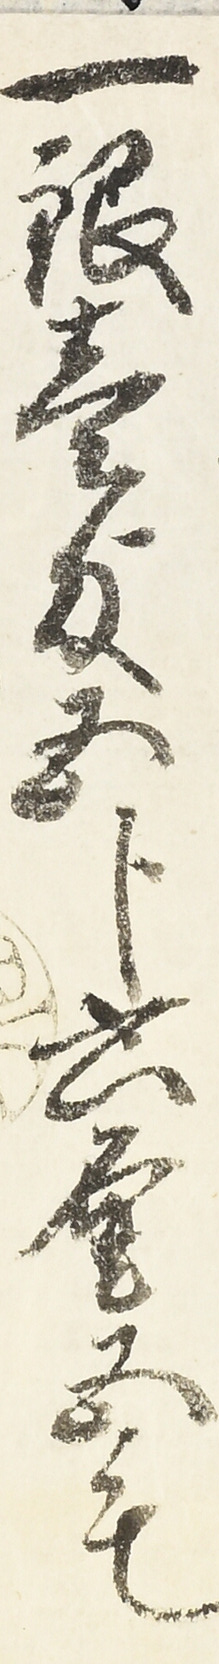一銀壱匁五分六厘五毛
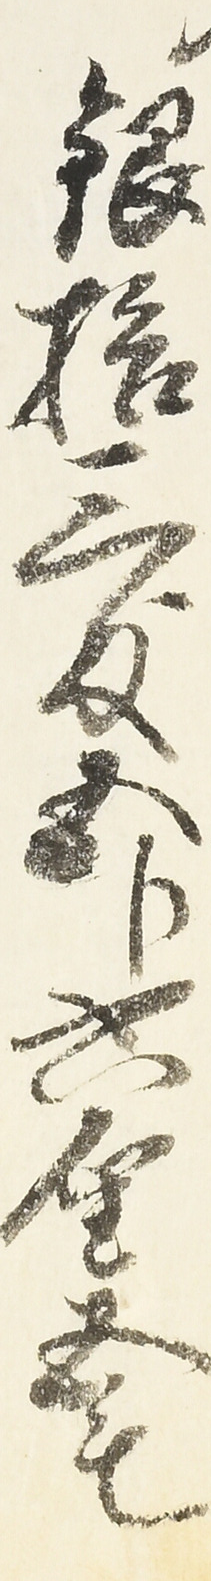銀拾三匁五分六厘五毛
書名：御才覚金御利足割渡扣帳
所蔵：伊那市立高遠町図書館・合同会社AMANE
